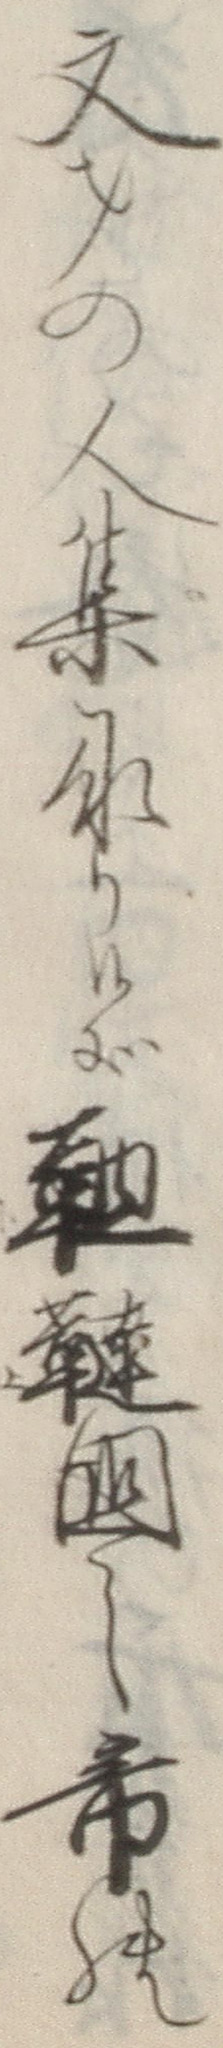文才の人集来り候処靼韃国之帝の
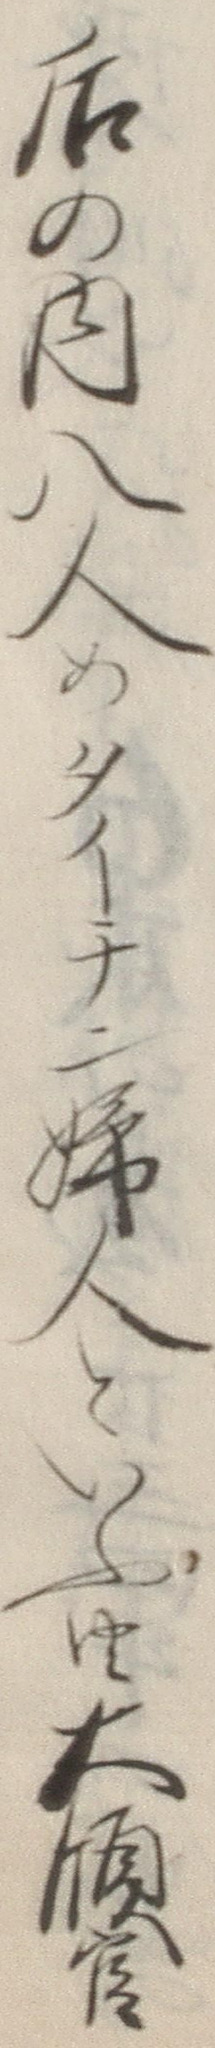后の内八人めタイチン婦人といふ由大領官
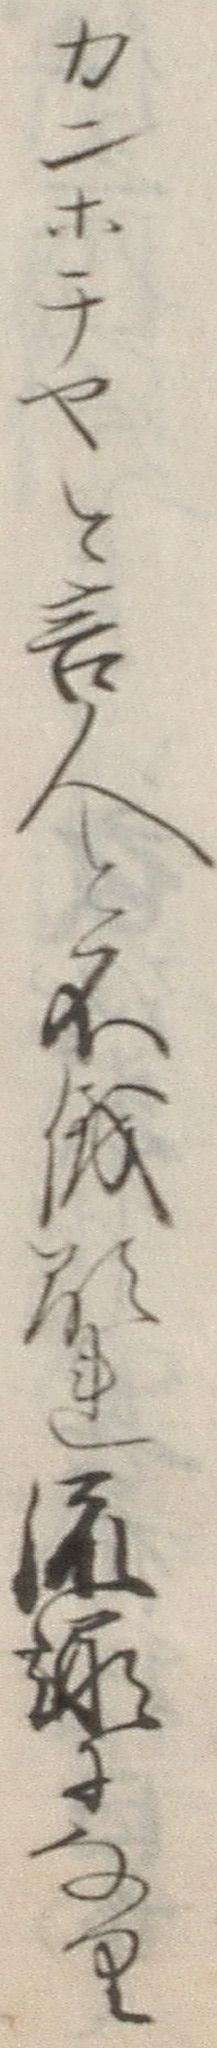カンホチヤと言人と不儀顕れ流罪になり
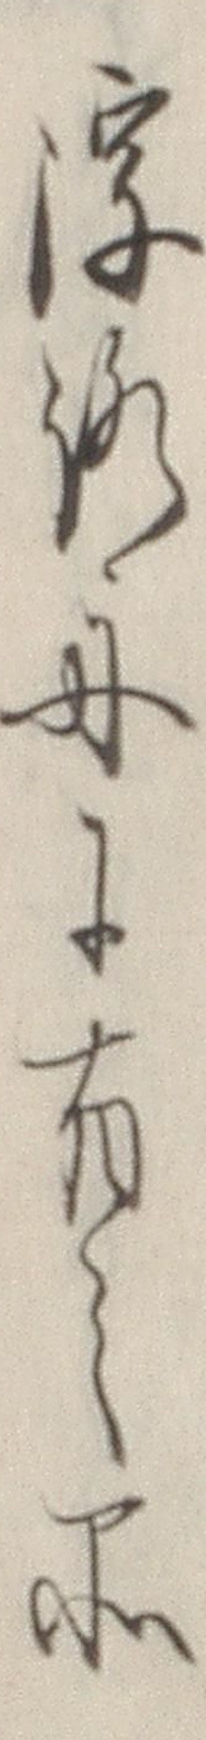浮路舟に有之品
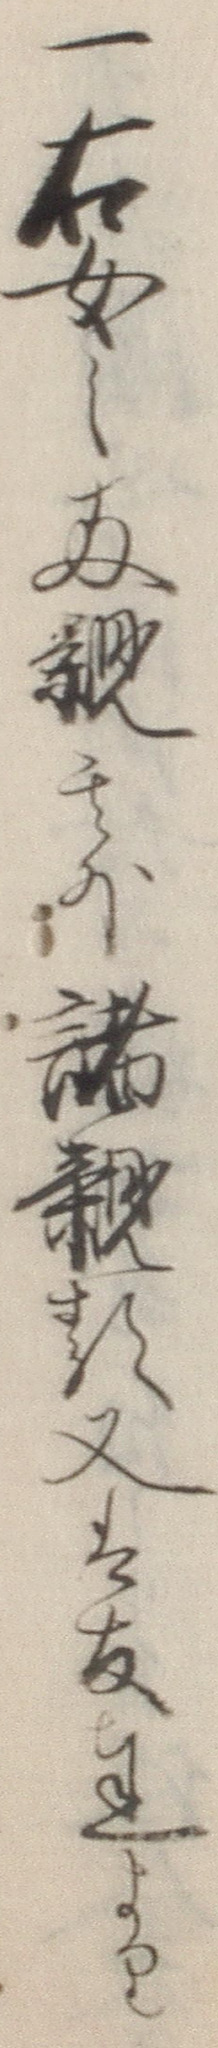一右女之両親其外諸親類又は友達より
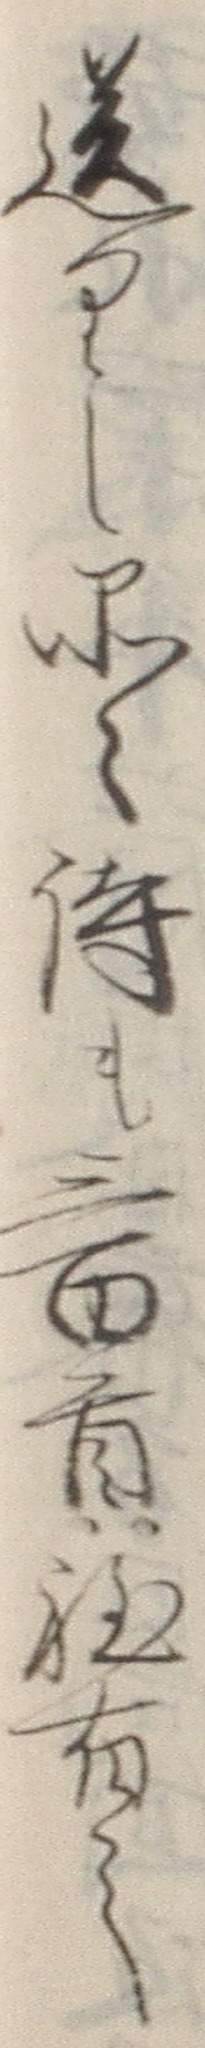送りし品々侍も三百首程有之
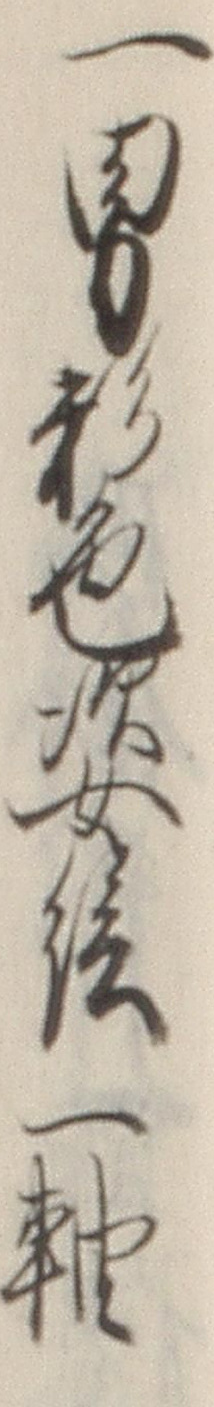一男彩色姿絵一軸
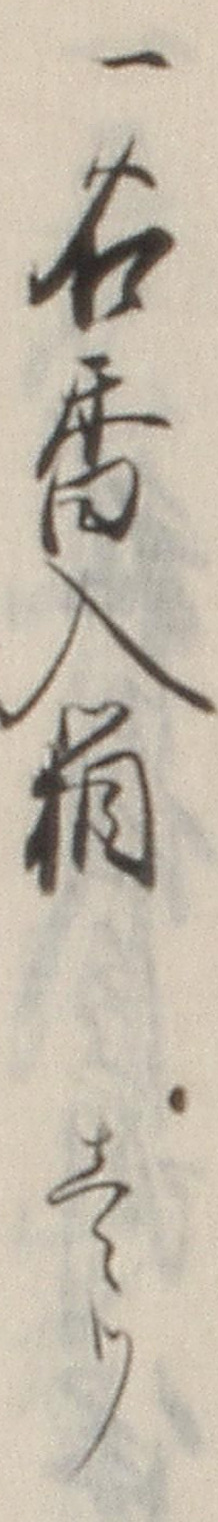一名香入箱壱ツ
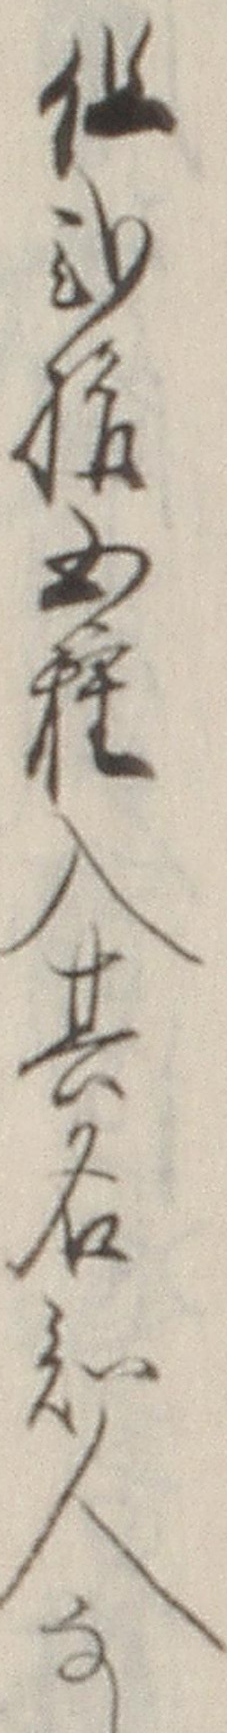但弐拾五種入其名知人なし
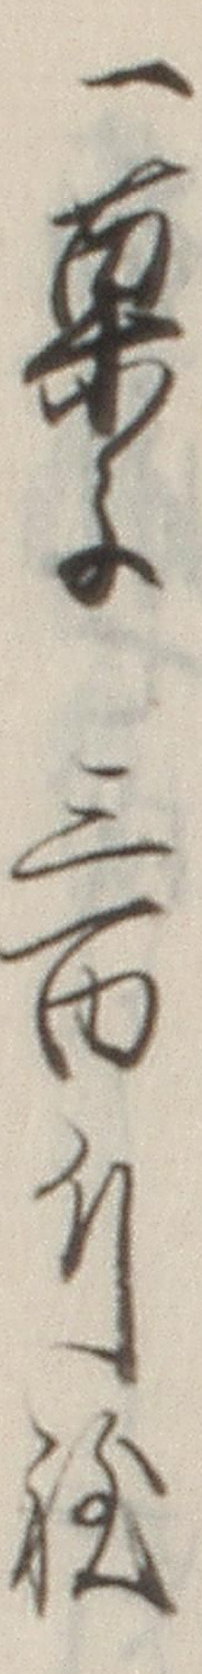一菓子三百斤程
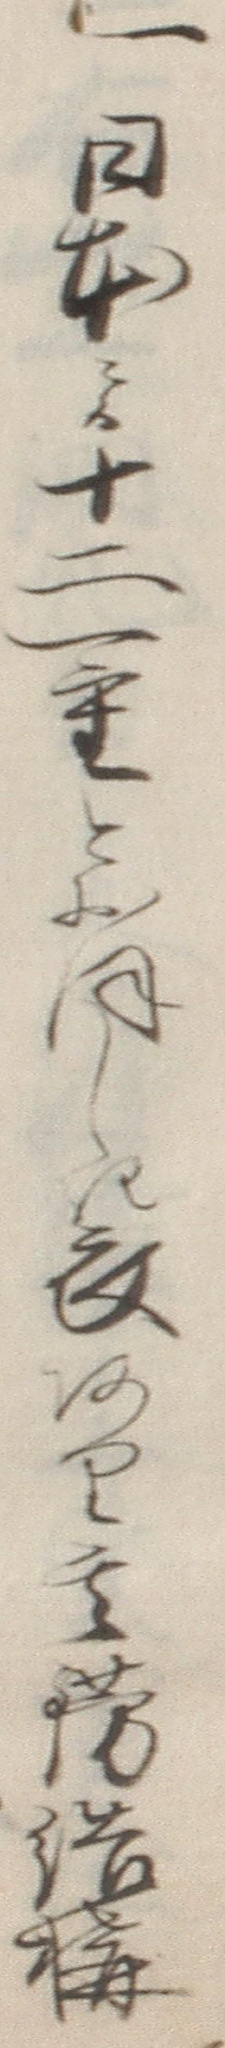一日本ニ而十二一重とおほしき衣あり其飾結構
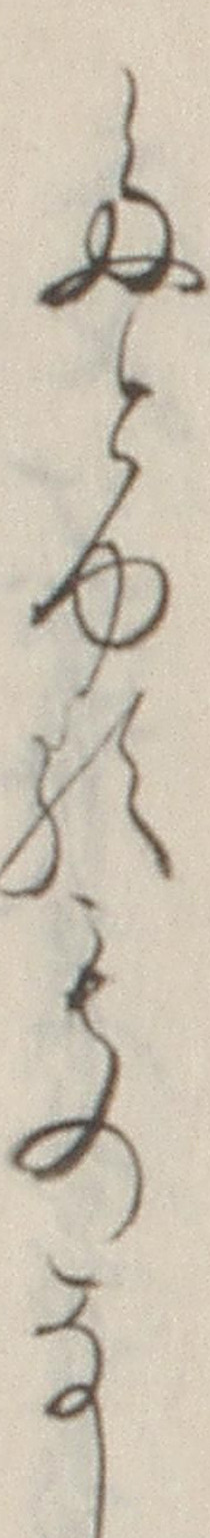たとゆるものなし
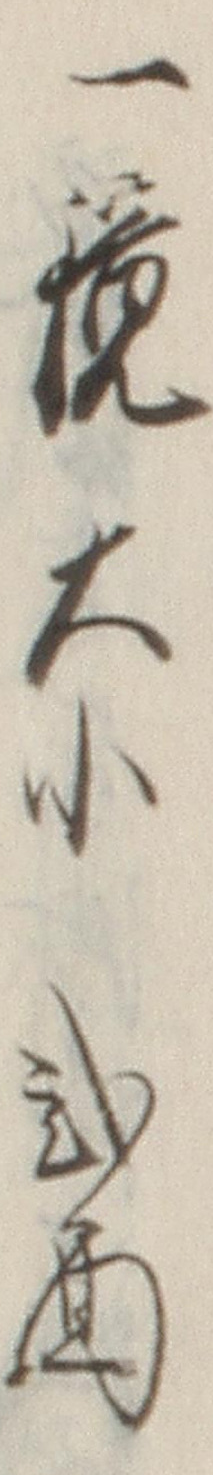一鏡大小弐面
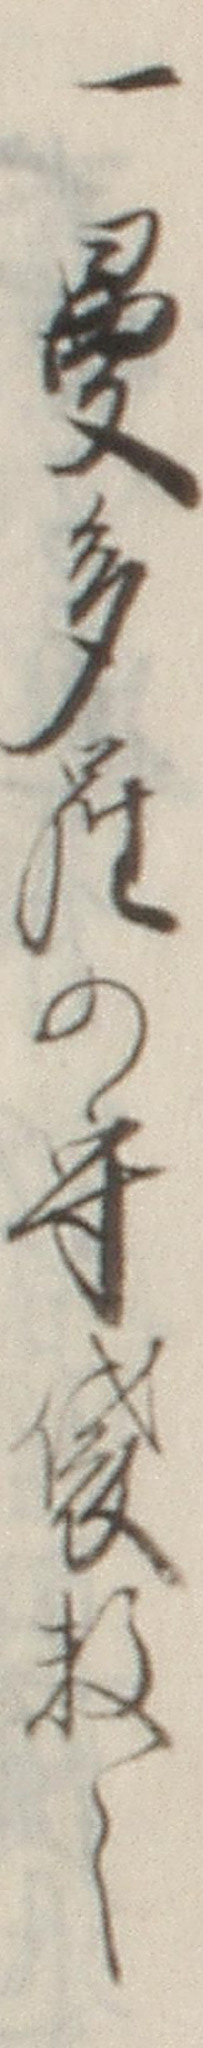一曼多羅の守袋数々
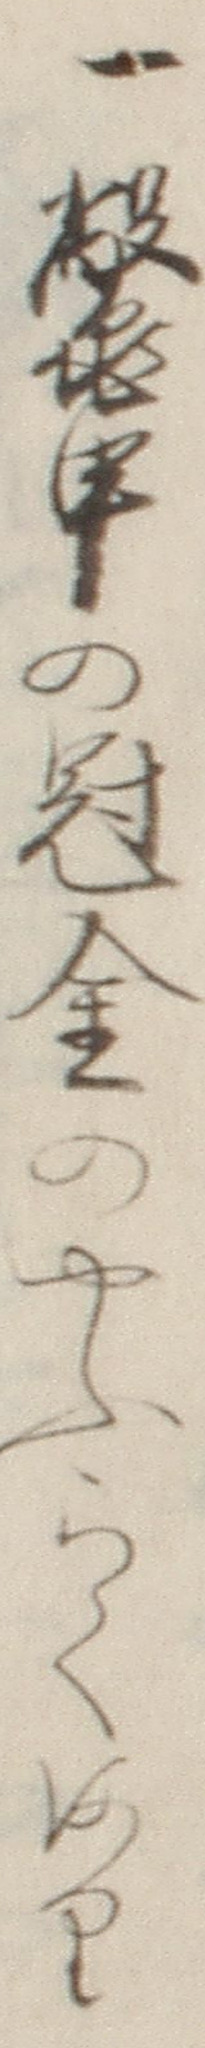一鼈甲の冠金のゆふらくあり
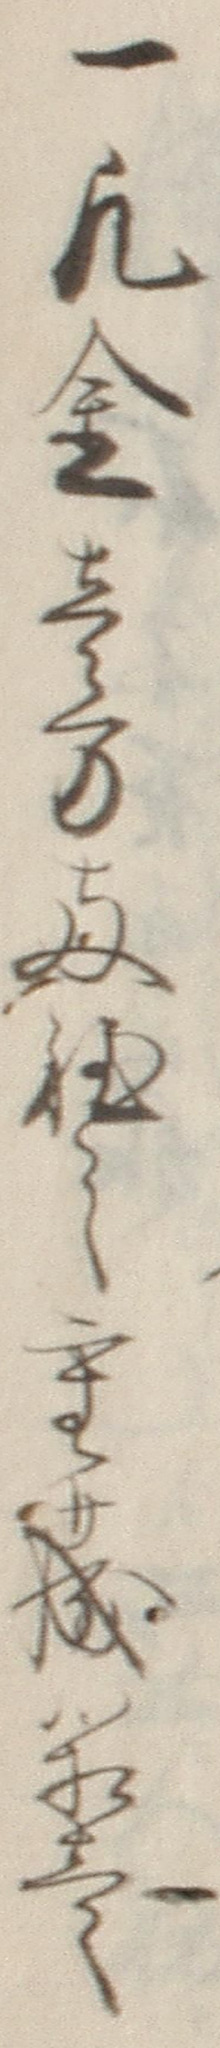一凡金一万両程之重サ成ハ箱壱
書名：[諸国災害記録]
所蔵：東京大学地震研究所図書室 Earthquake Research Institute Library, The University of Tokyo, JAPAN
